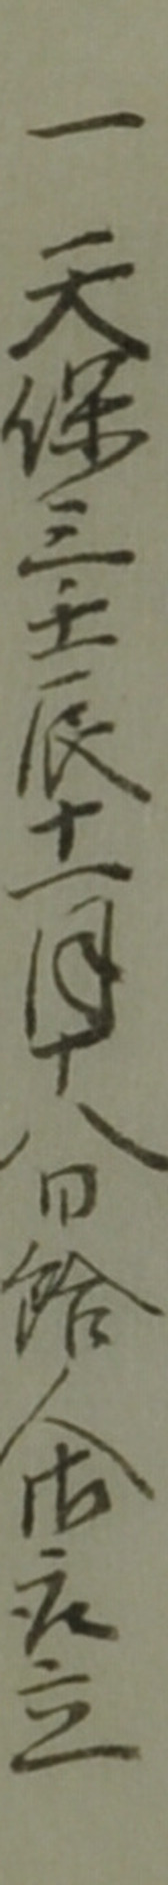一天保三壬辰十一月十八日給人御取立
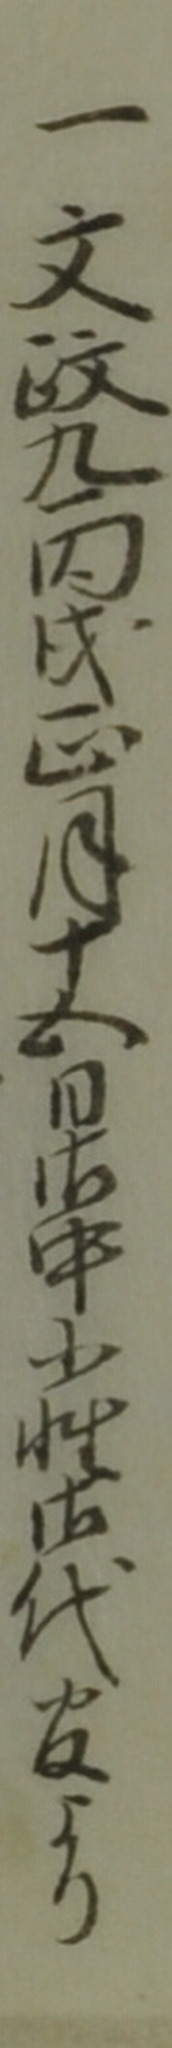一文政九丙戌正月十五日御中小姓御代官より
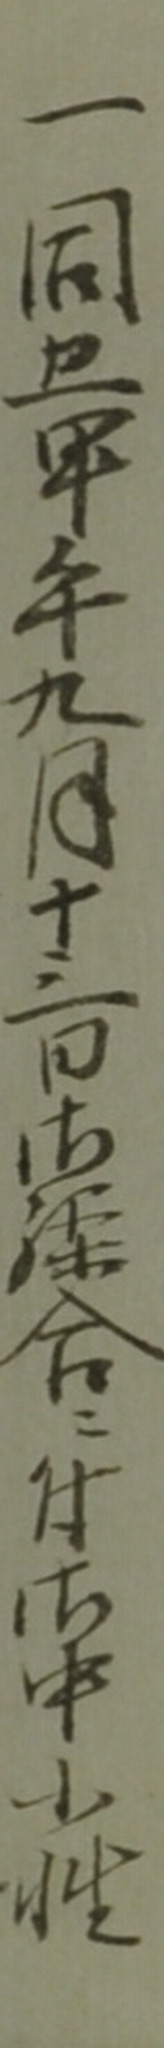一同五甲午九月十三日御繰合に付御中小姓
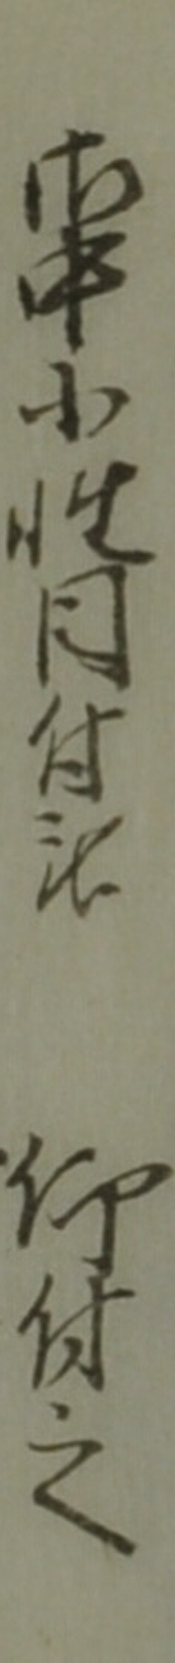御中小姓目付被仰付之
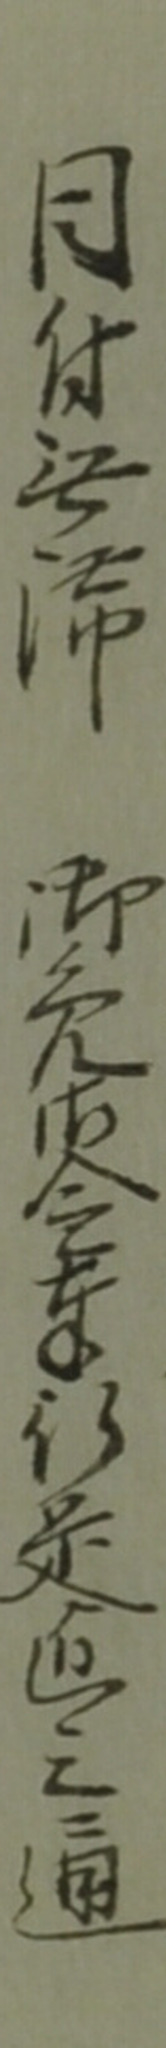目付無滞御免御金奉行是迄之通
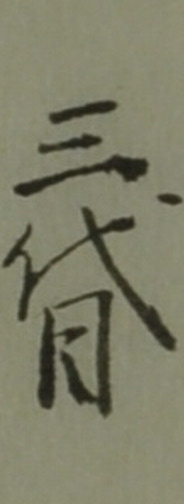三代目
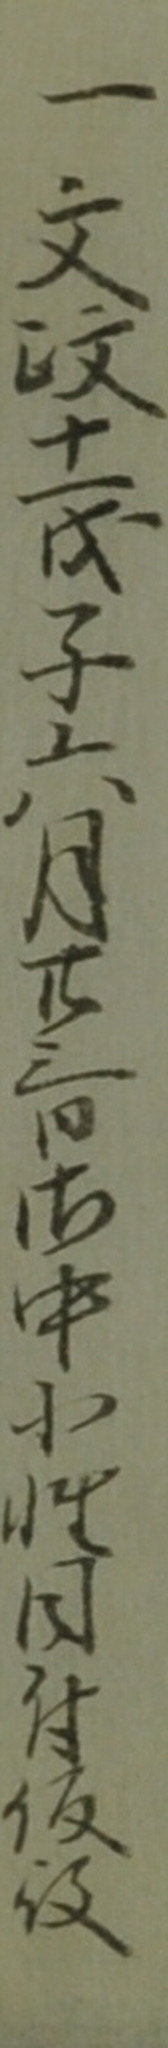一文政十一戊子六月廿三日御中小姓目付仮役
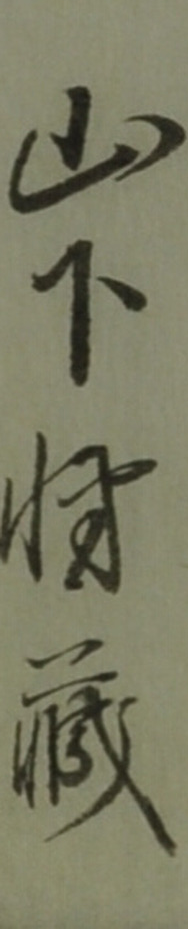山下悌蔵
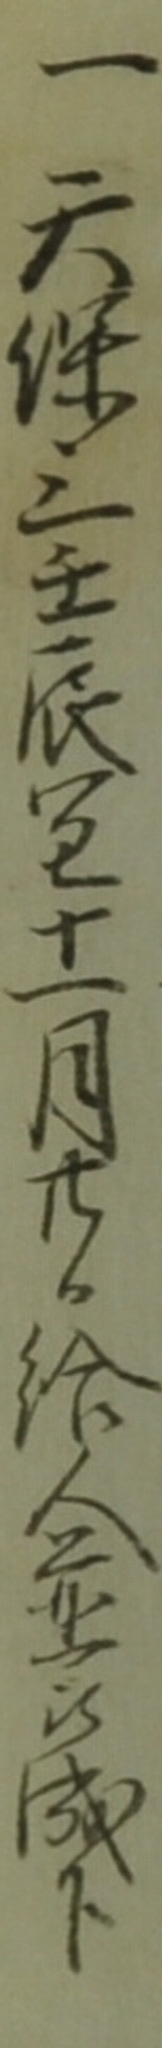一天保三壬辰閏十一月廿日給人並被成下
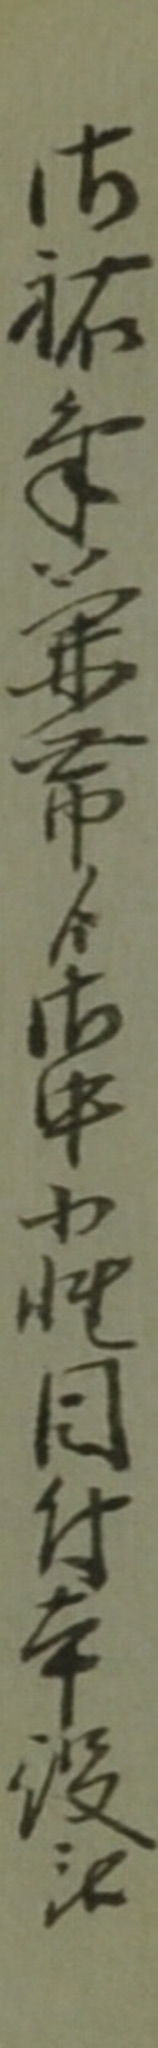御祐筆兼帯より御中小姓目付本役被
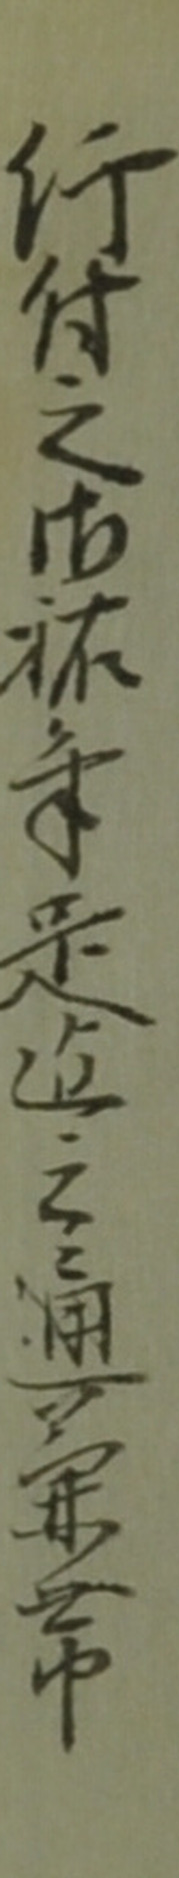仰付之御祐筆是迄之通兼帯
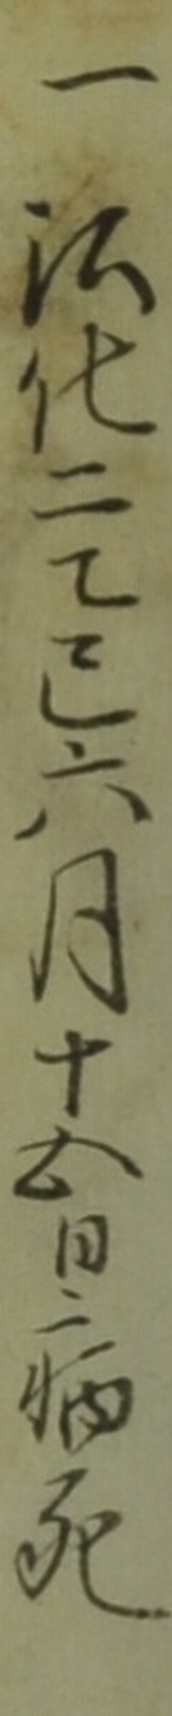一弘化二乙巳六月十五日病死

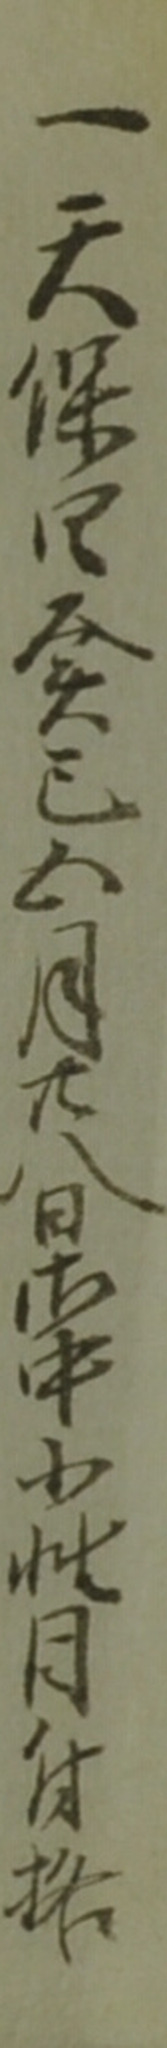一天保四癸巳五月廿八日御中小姓目付格
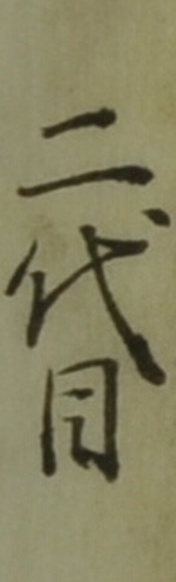二代目
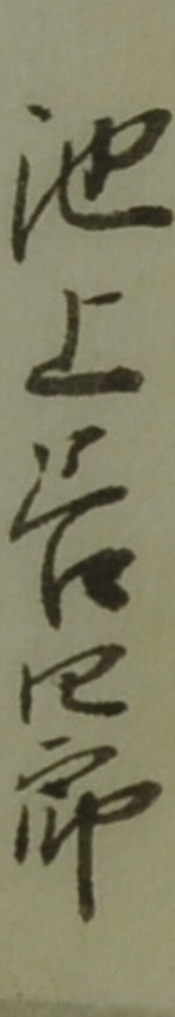池上善四郎
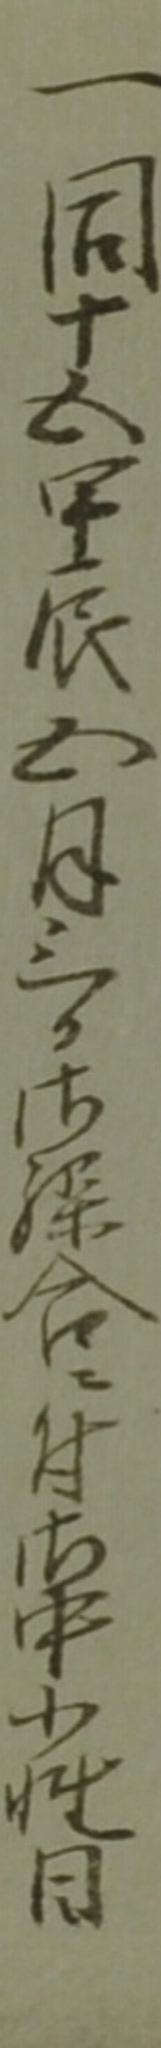一同十五日甲辰五月三日御繰合に付御中小姓目
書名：諸御役代々録（八）
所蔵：伊那市立高遠町図書館・合同会社AMANE
